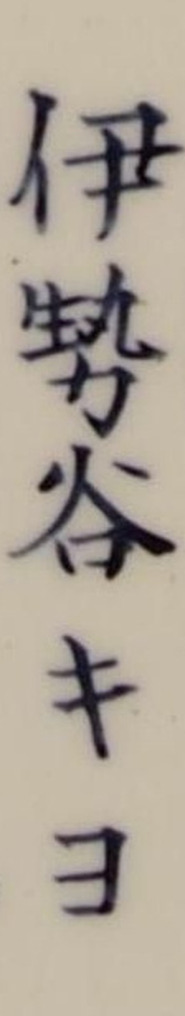伊勢谷キヨ
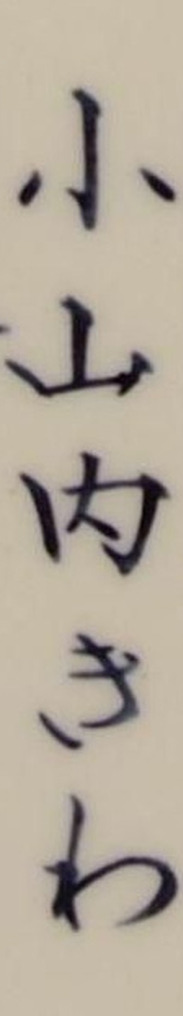小山内きわ
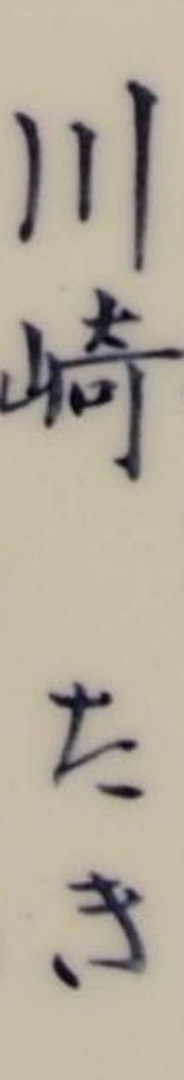川崎たき
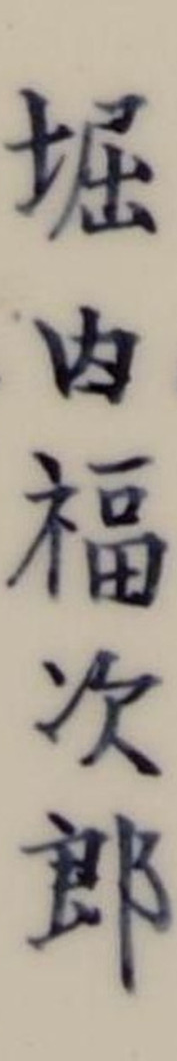堀内福次郎
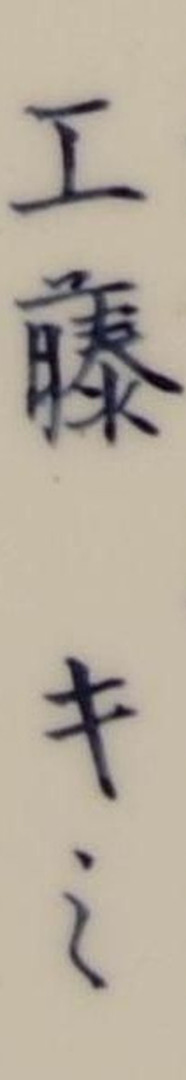工藤キミ
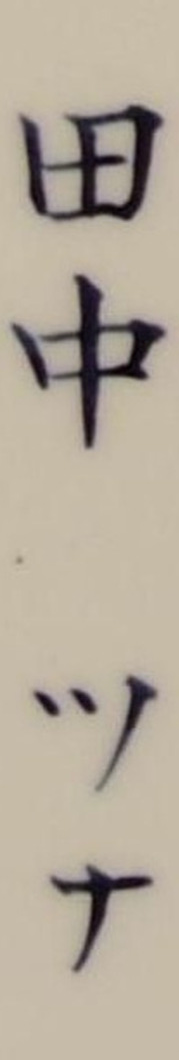田中ツナ
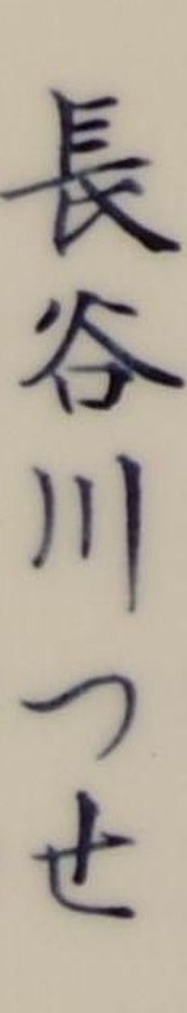長谷川つせ
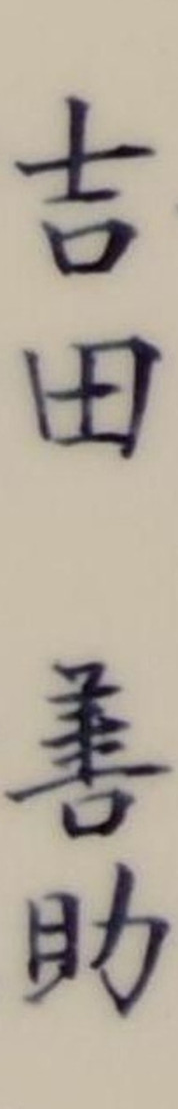吉田善助
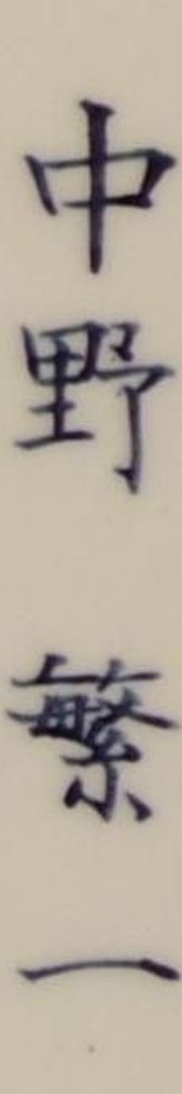中野繁一
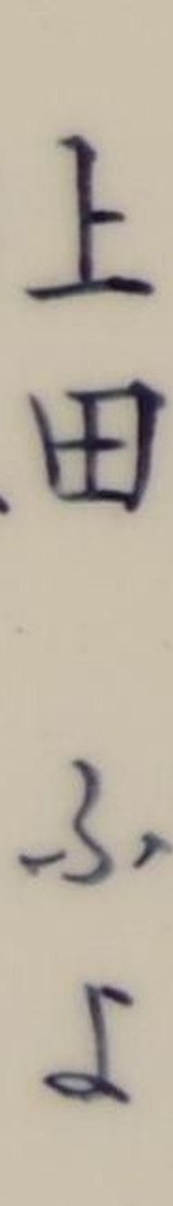上田ふよ
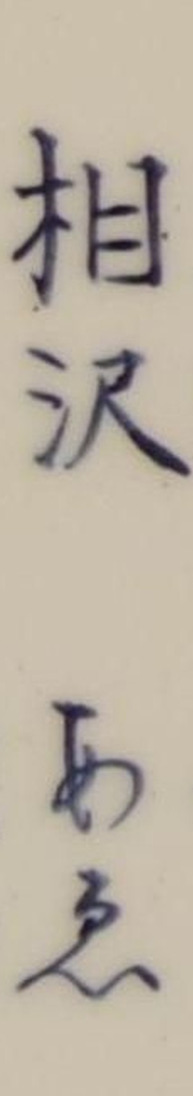桐沢あゑ

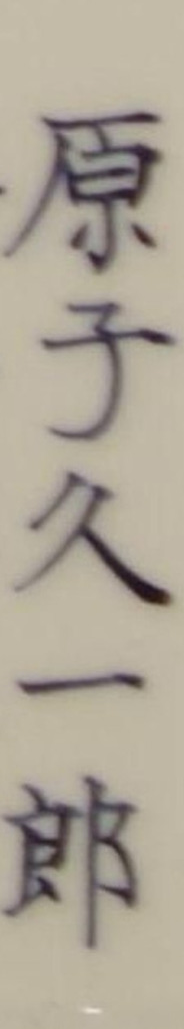原子久一郎
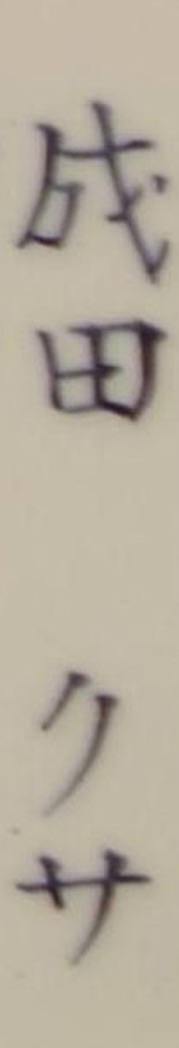成田クサ
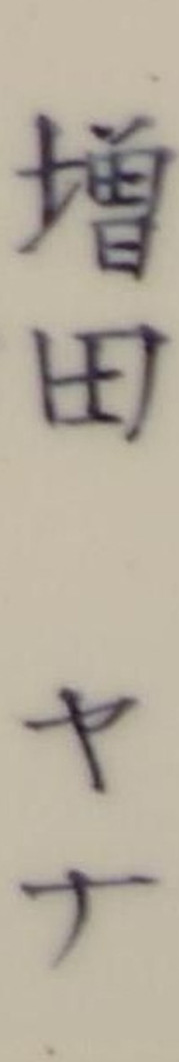増田ヤナ
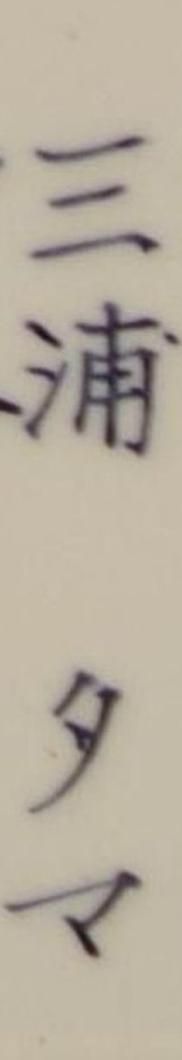三浦タマ
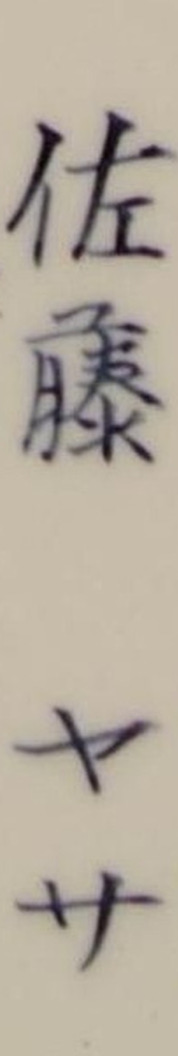佐藤ヤサ
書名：M~S
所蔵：高野山金剛峯寺
